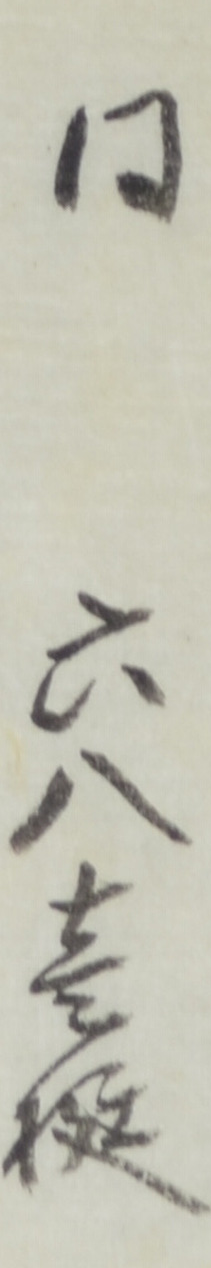同六八壱挺
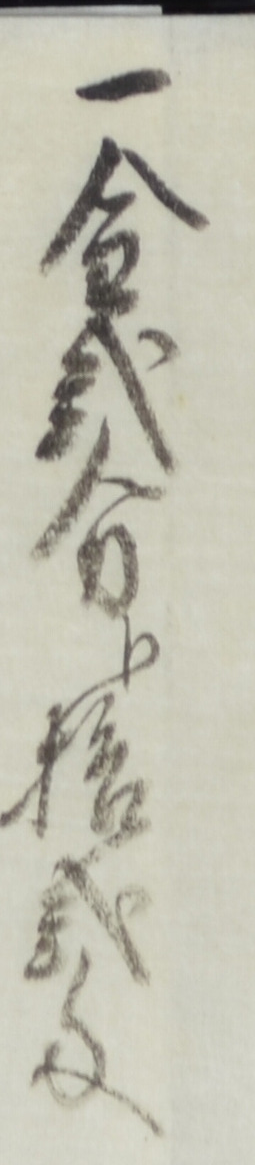一金弐分ト拾弐匁
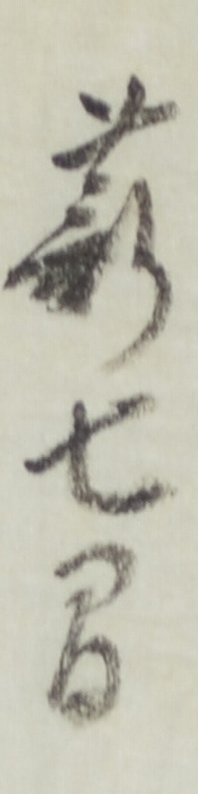薪七間
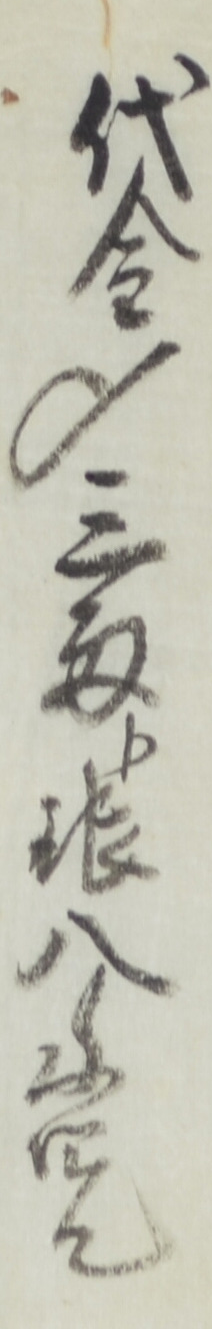代金〆三両ト銀八匁四厘
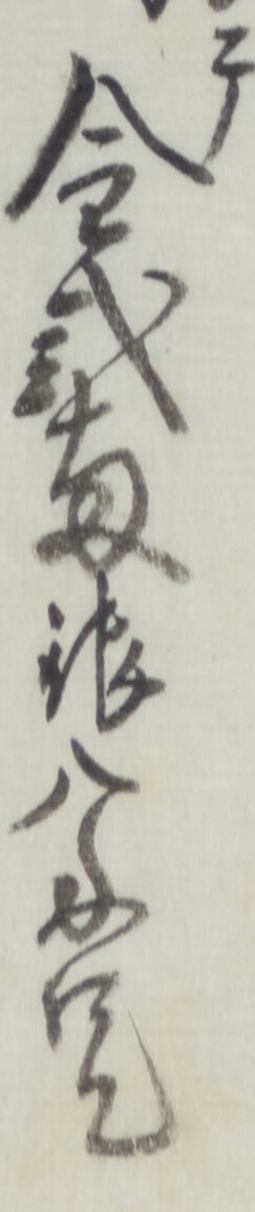金弐両銀八匁四厘

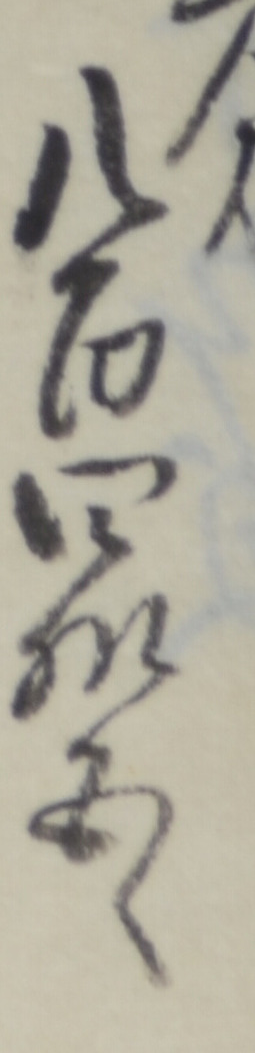八百四拾五文
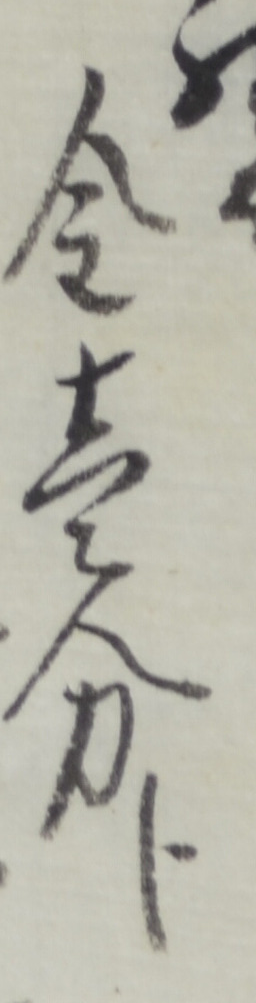金壱分ト
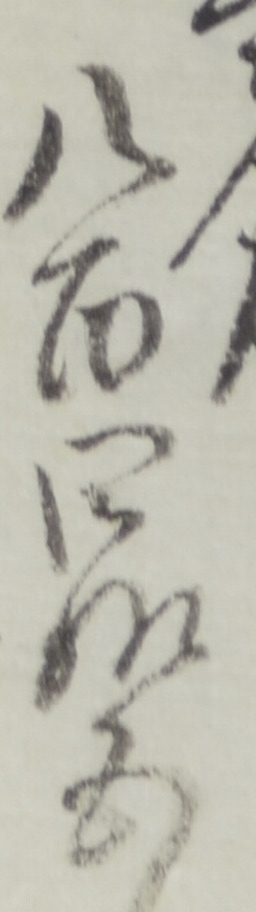八百四拾五文
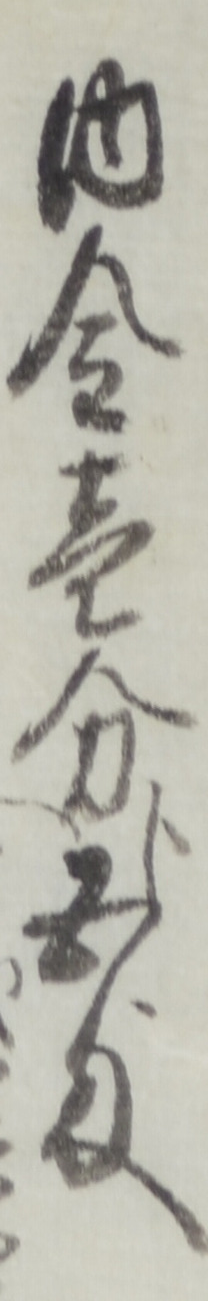内金壱分ト五匁
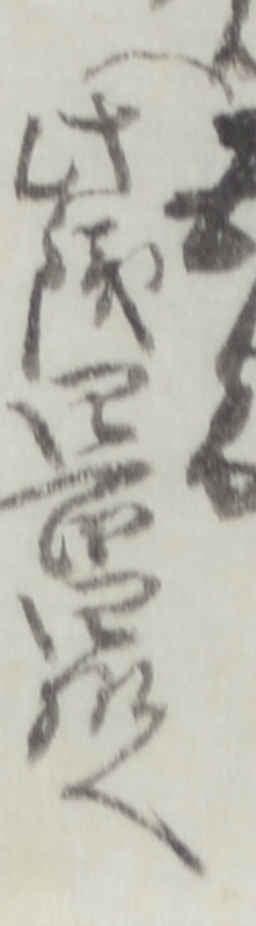此銭四百四拾文
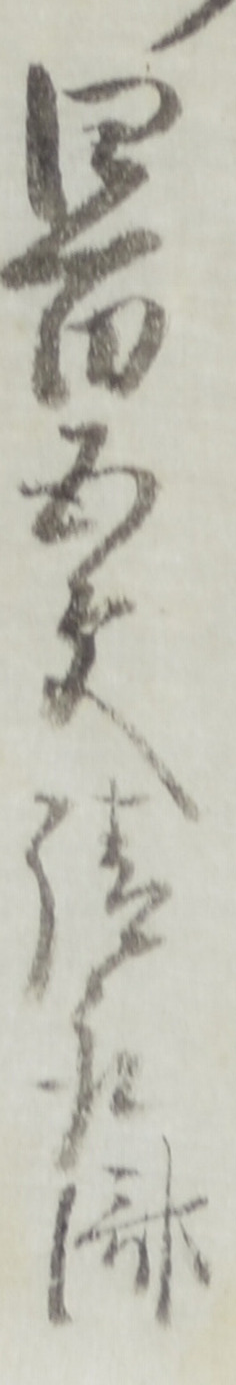四百五文請取済
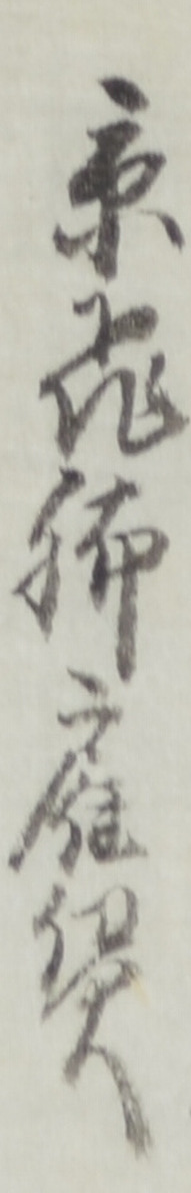京飛脚雇賃
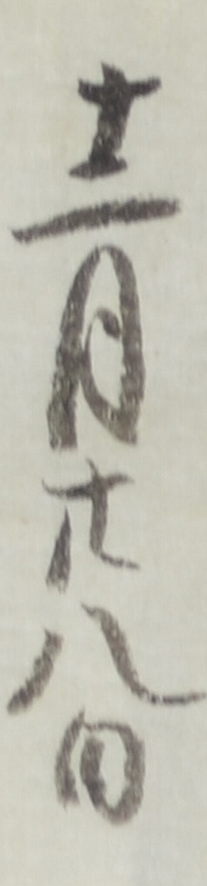十二月廿八日

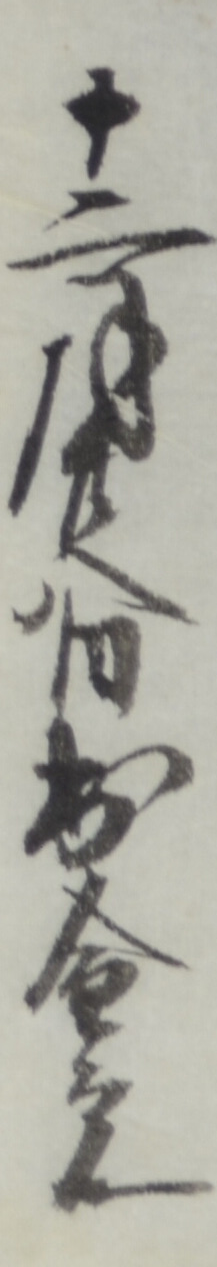十二月廿八日出金覚
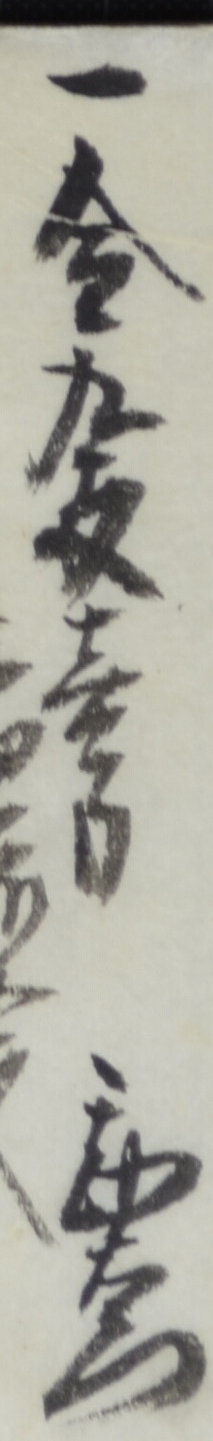一金九両壱分勘右衛門
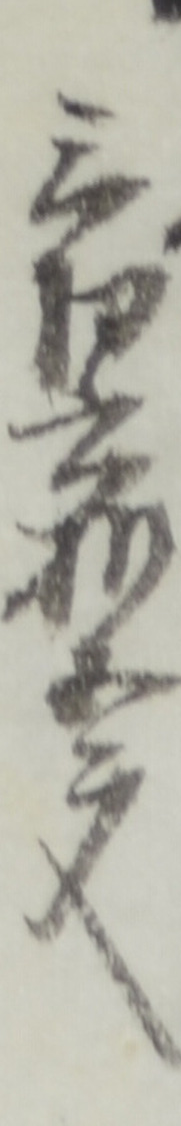三百六拾五文
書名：権現分拂方
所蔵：伊那市立高遠町図書館・合同会社AMANE
